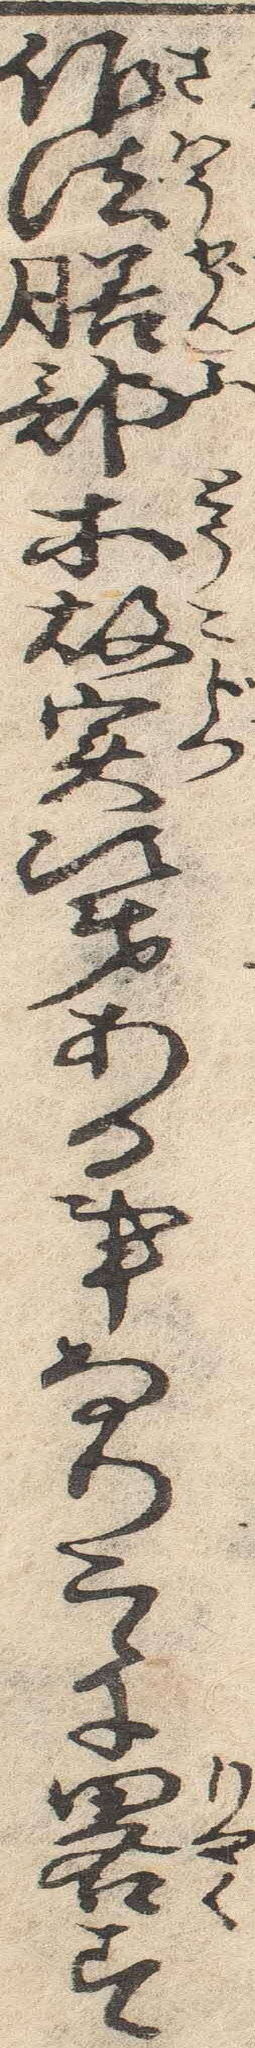作法膳部等故実次第ある事なりこゝに畧す
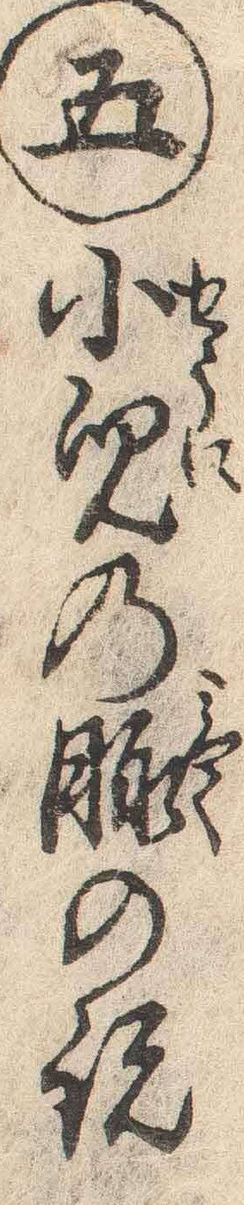㊄小児の脉の説
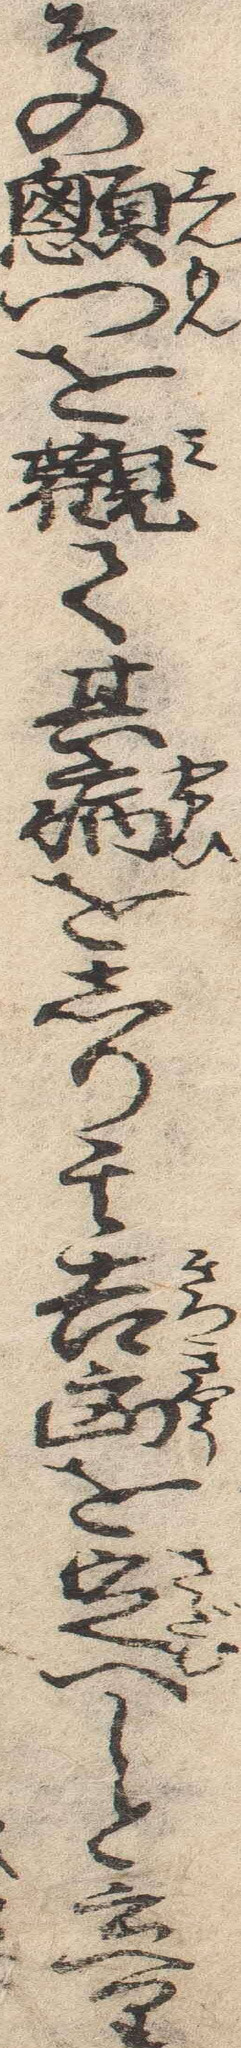その顖門を觀て其病をしり其吉凶を定へしと云へり
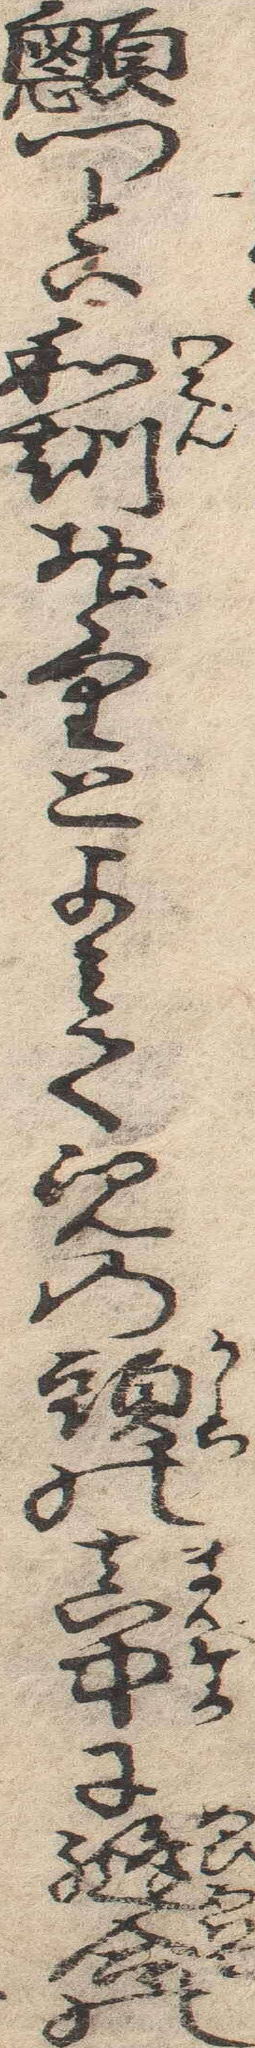顖門とは和訓おどりとよみて児の頭の真中に縫合の
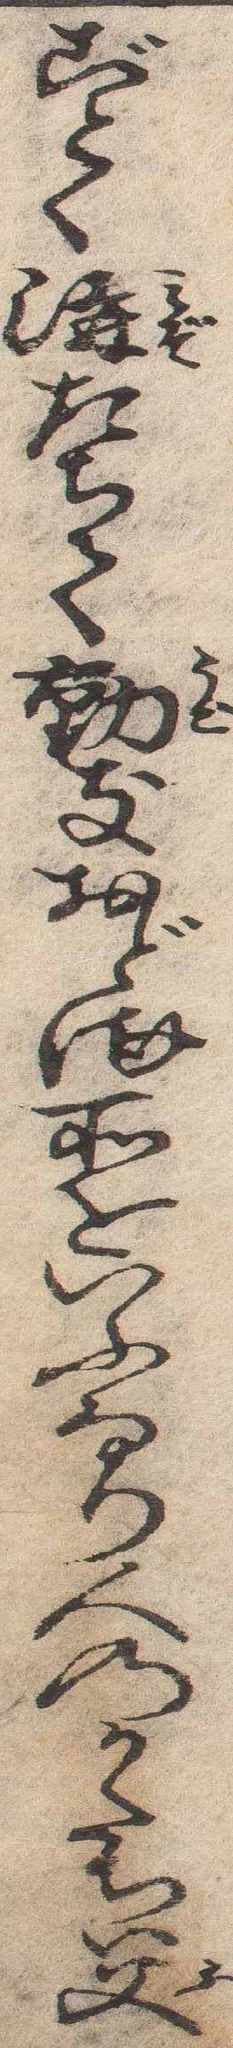ごとく溝たちて動きおどる所をいふなり人のかたちは父

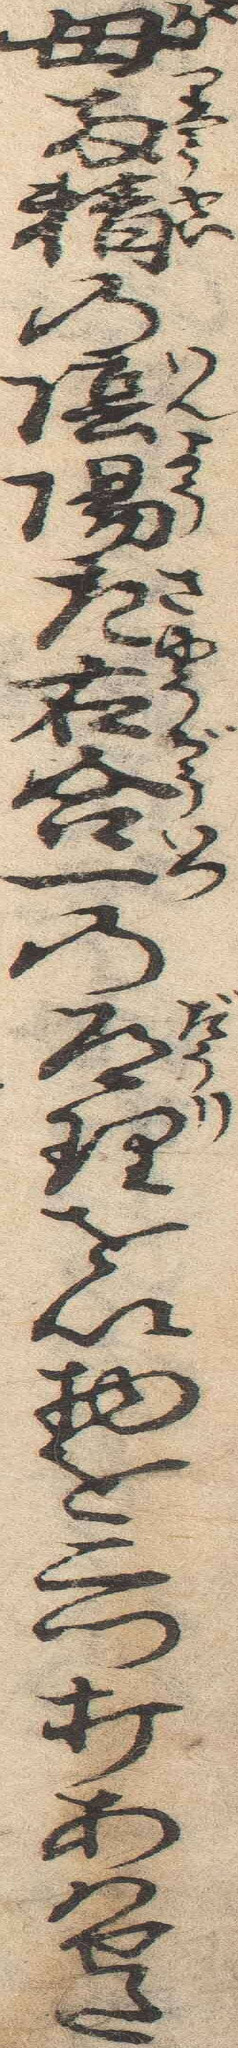母両精の陰陽左右合一の道理を以物を二つ打あはせた
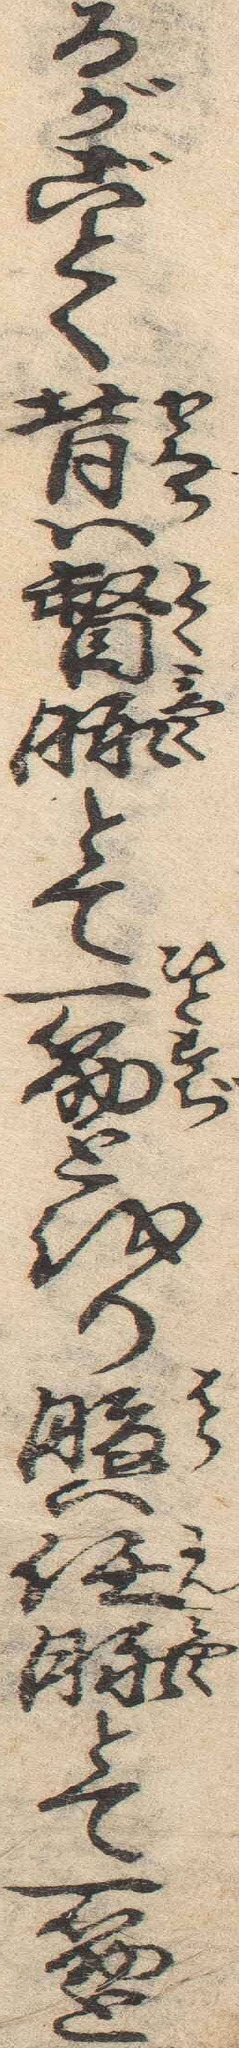るがごとく背は督脉とて一筋とをり腹は任脉とて一筋と
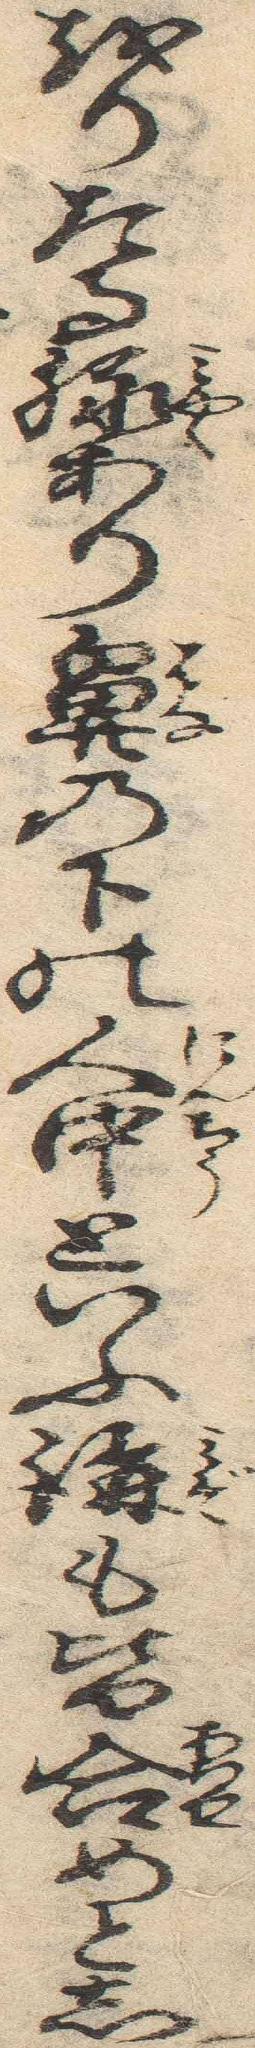をりたる脉あり鼻の下の人中といふ溝も皆合めとし
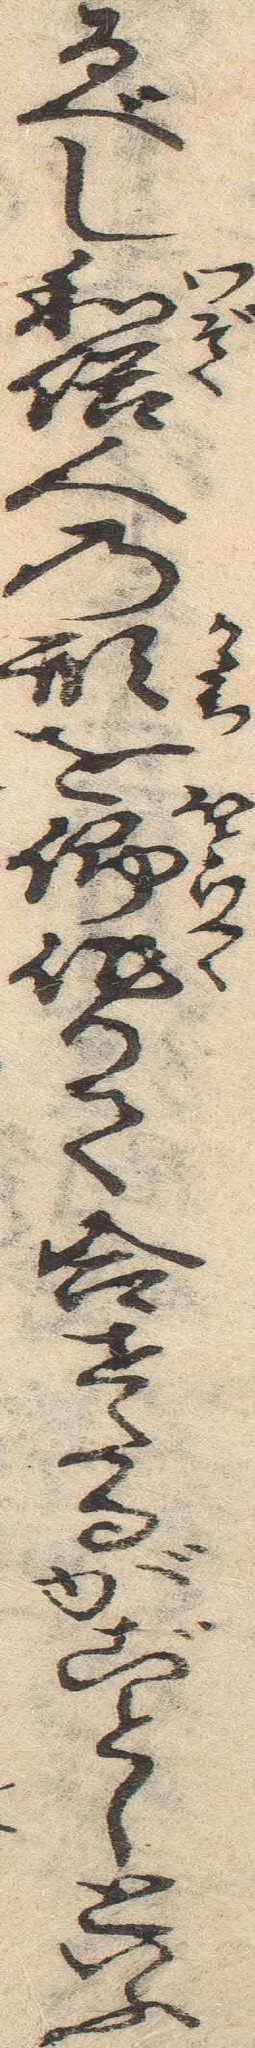るべし和俗人の形を佛作りて合せたるがごとしといふ
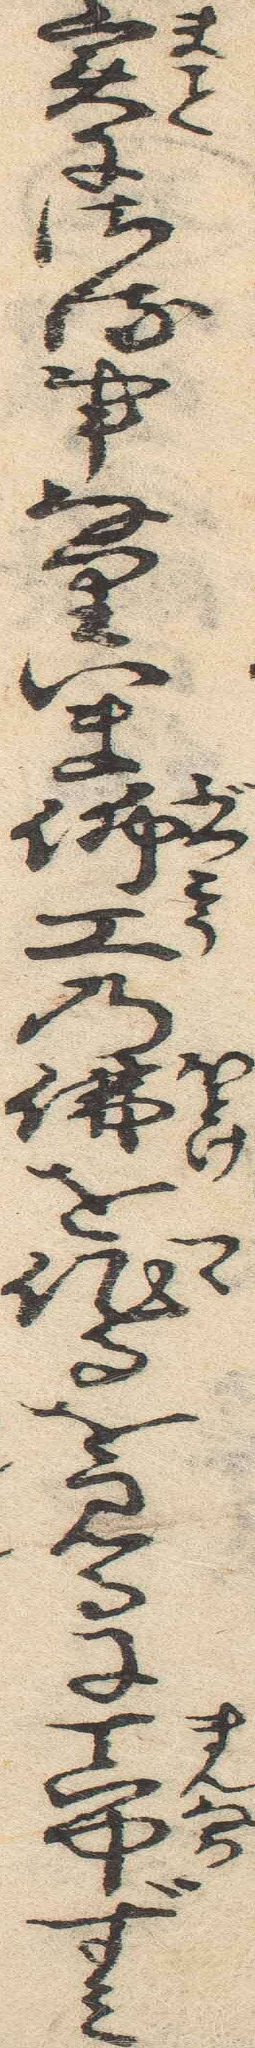実にさる事なりいま佛工の佛を作るを見るに真中ずみ
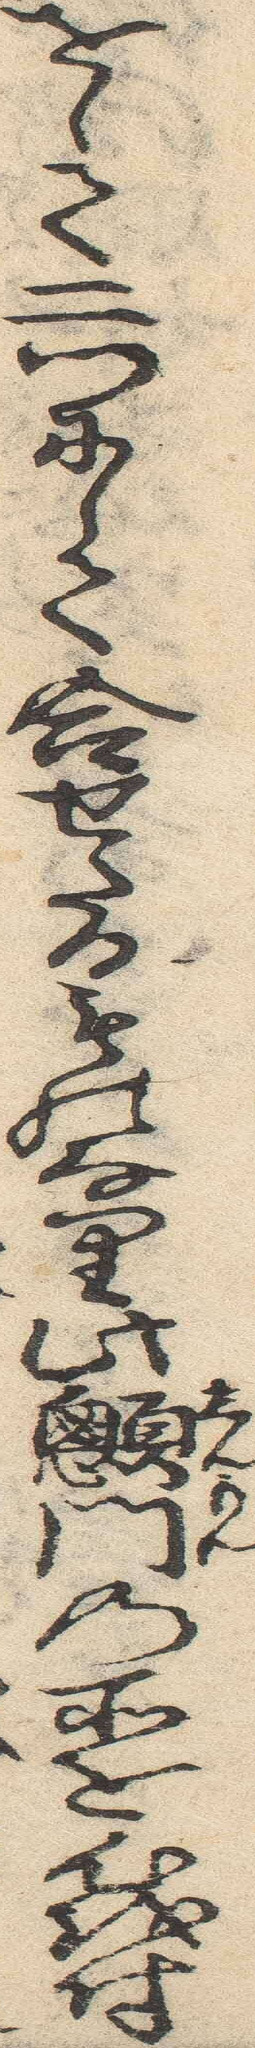をして二つにして合せたるものなり此顖門の所を心を付
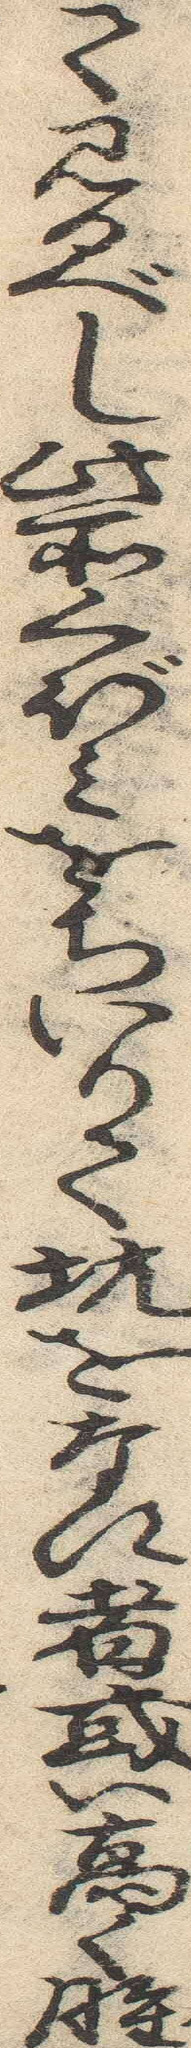て見るべし此所くぼみをちいりて坑をなす者或は高く腫
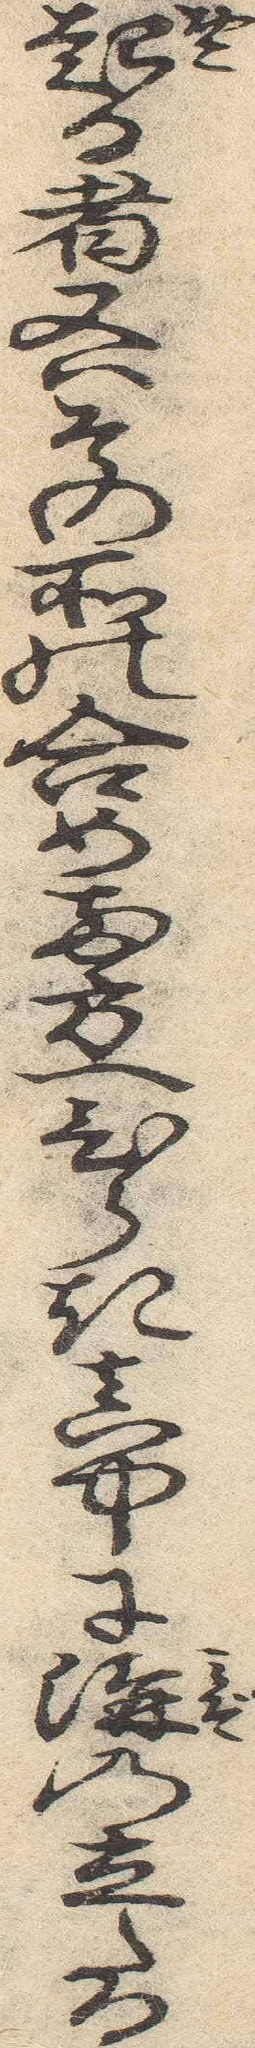起る者又はその所の合め両方へひらき真中に溝の立たる
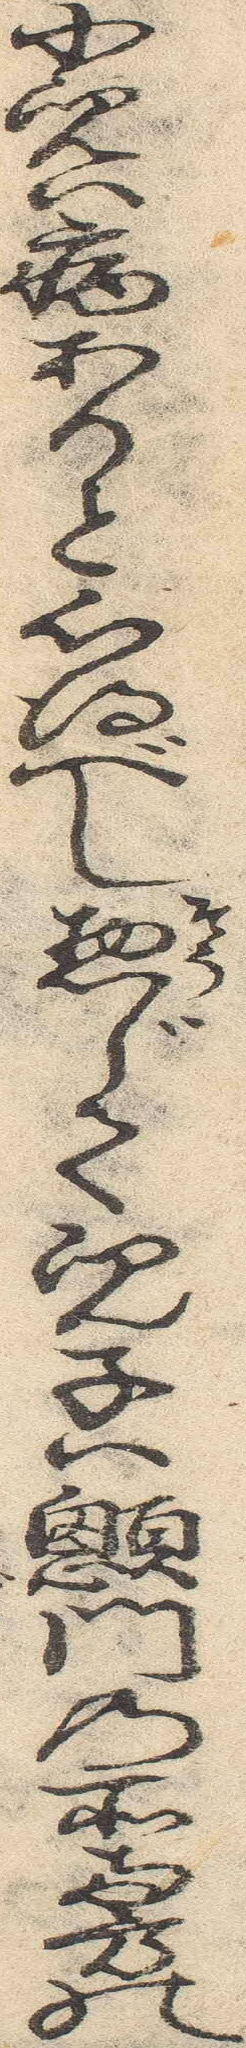小児は病ありと心得べし惣じて児子は顖門の所両方の
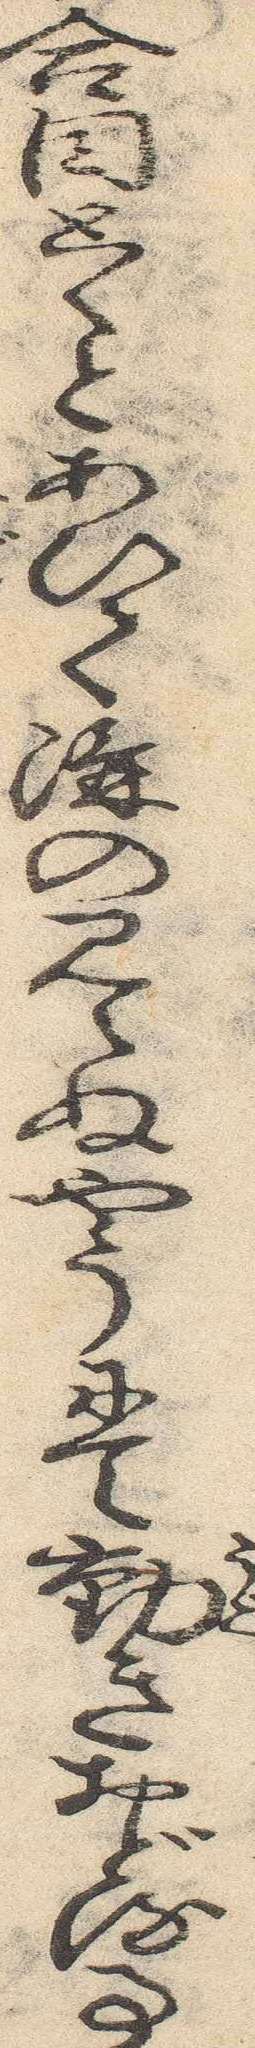合目とくとあひて溝の見えぬやうにて動きおどる事
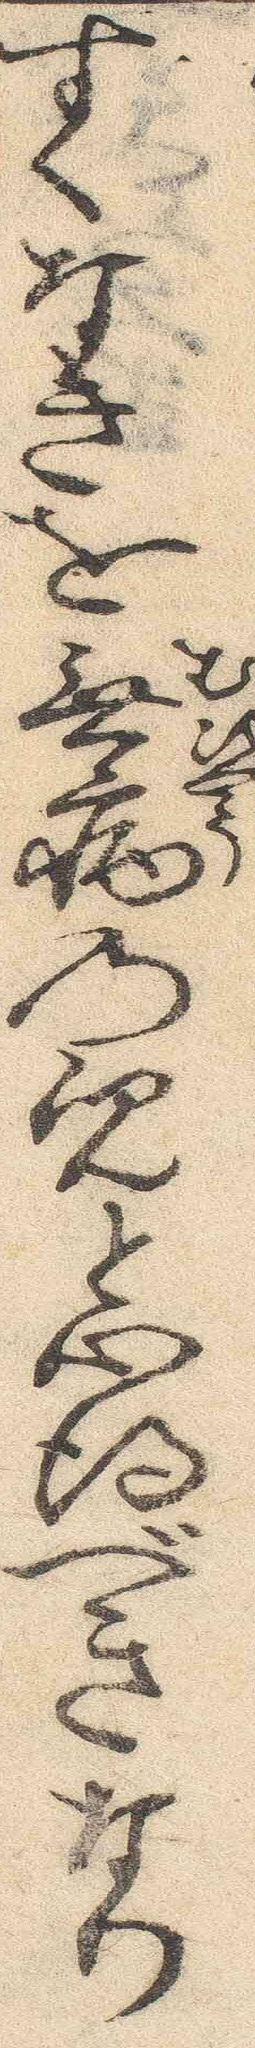すくなきを無病の児と心得べきなり
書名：小児必用養育草
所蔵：東京学芸大学附属図書館 国文学研究資料館
